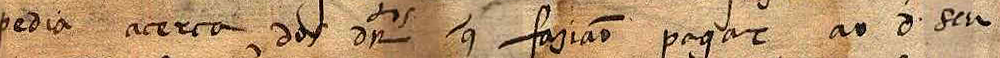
pedia acerca dos drrtos q̄ fazião pagar ao d. seu
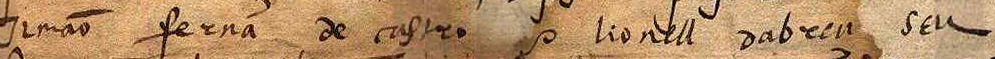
Jrmão fernā de castro e lionell dabreu seu
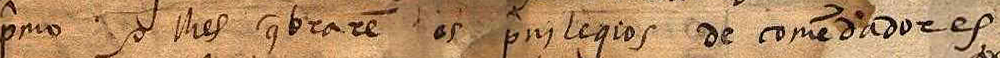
p̄mo e lhes q̄brarē os p̄ujlegios de comēdadores
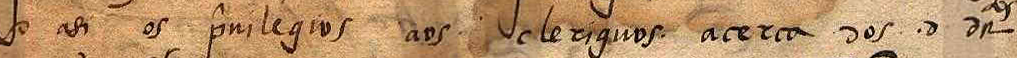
e asi os p̄uilegios aos cleriguos acerca dos d. drrtos
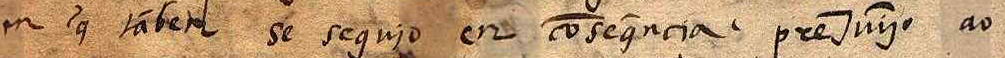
em q̄ tābem se segujo em c̄oseq̄ncia preJuizo ao
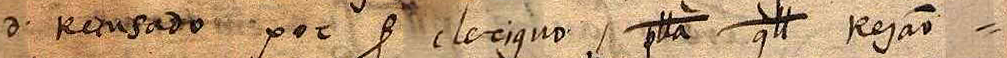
d. Recusado por ꞩ cleriguo / p̄lla q̄ll Rezão
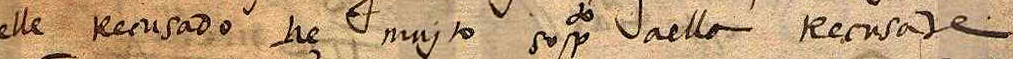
elle Recusado he mujto sospto a ella Recusāte
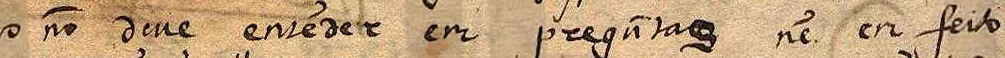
e n̄o deue entēder em pregūtas nē em feito
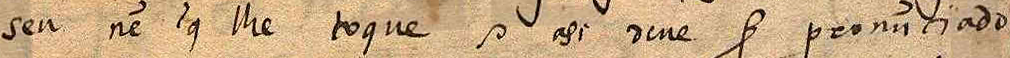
seu nē q̄ lhe toque e asi deue ꞩ pronūciado
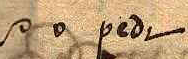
e o pede
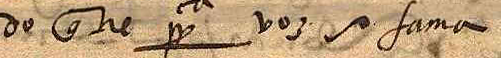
do q̄ he ꝓpca voz e fama
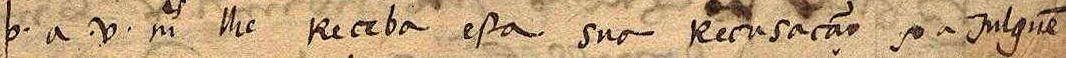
p. a .v. mes lhe Receba esta sua Recusação e a Julguē
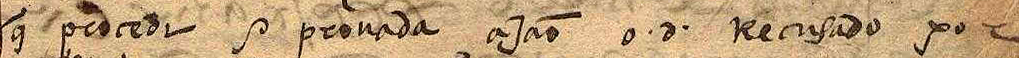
q̄ procede e prouada aJaõ o d. Recusado por
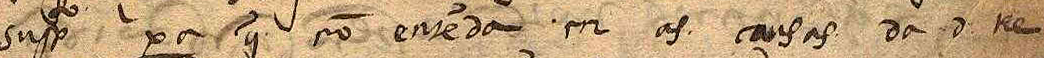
suspto ꝑa q̄ no entēda em as causas da d. Re
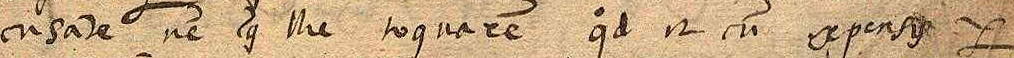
cusāte nē q̄ lhe toquarē qod et cū expensis ꝑ
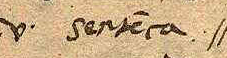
v. sentēça .//
